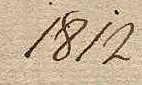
1812
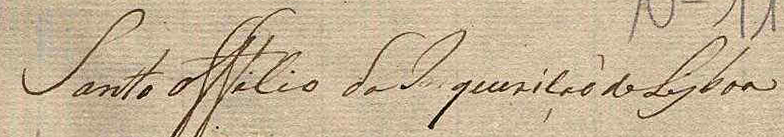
Santo offiCio da Inquiziçaõ de Lisboa
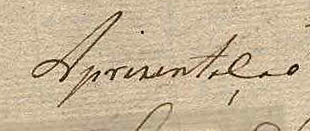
Aprezentaçaõ
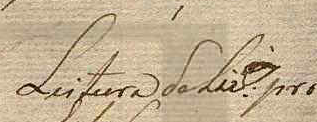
Leitura de liv. pro
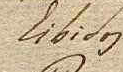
hibidos
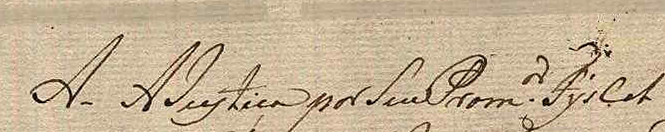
A. A Iustiça por seu Prom.or fysCal
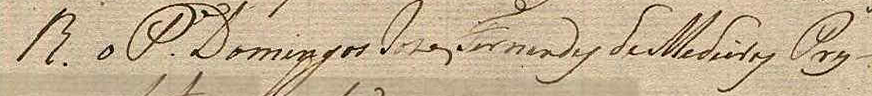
R. o P.e Domingos Ioze Fernandes de Medeiros Pres
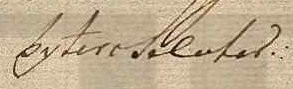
bytero Secular.
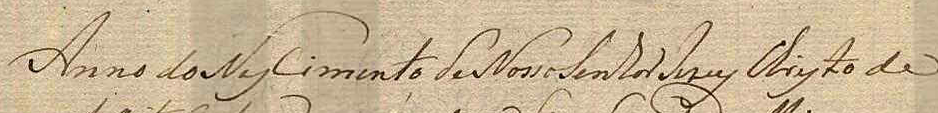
Anno do NasCimento de Nosso Senhor Iezus Christo de
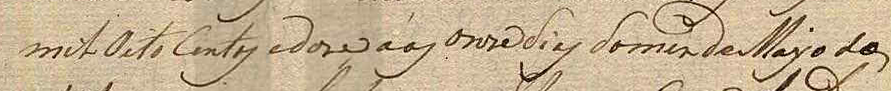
mil OitoCentos e doze aos onze dias do mez de Mayo do
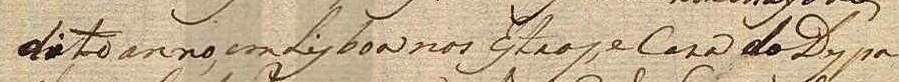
dito anno, em Lisboa nos Estaos, e Caza do Despa
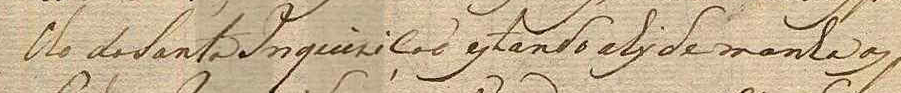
Cho da Santa Inquiziçaõ estando ahy de manha os
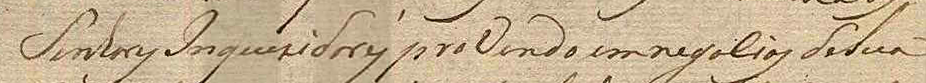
Senhores Inquizidores proVendo em negocios de sua
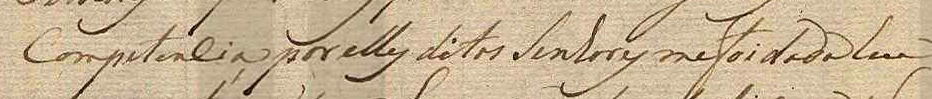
Competencia por elles ditos Senhores me foi dada hua
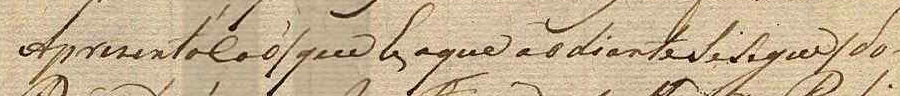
Aprezentaçaõ/ que he o que ao diante se segue do
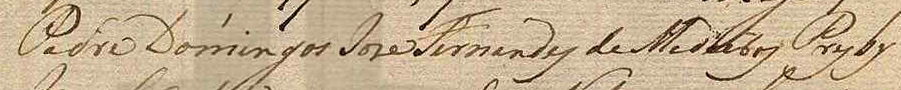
Padre Domingos Ioze Fernandes de Medeiros Presby
